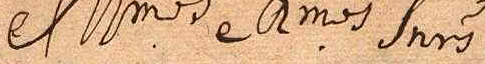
Ill.mos e R.mos Snrs̄.
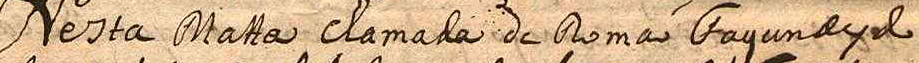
Nesta Matta chamada de Romaõ Fagundes do
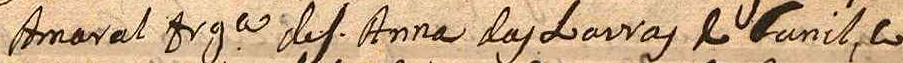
Amaral freg.a de S. Anna das Lavras do Funil, co
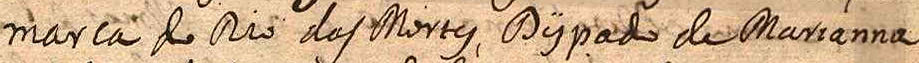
marca do Rio das Mortes, Bispado de Marianna
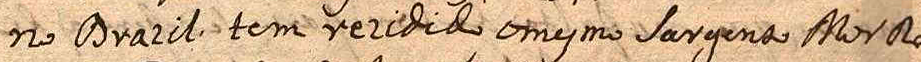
no Brazil tem rezidido o mesmo Sargento Mor Ro
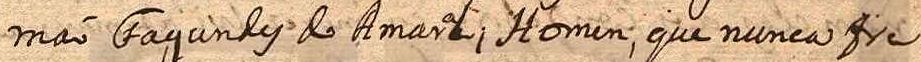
maõ Fagundes do Amaral, Homen; que nunca fre
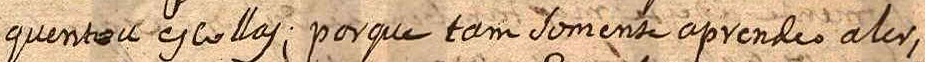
quentou escollas; porque tam somente aprendeo a ler,
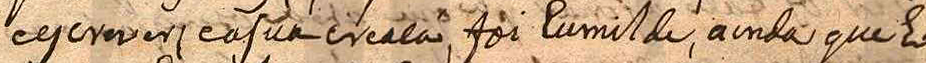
e escrever e a sua creacaõ, foi humilde, ainda que ho
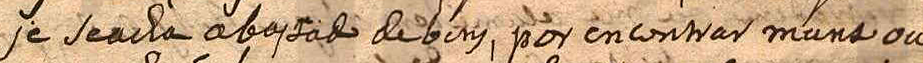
je se acha abastado de bens, por encontrar munto ou
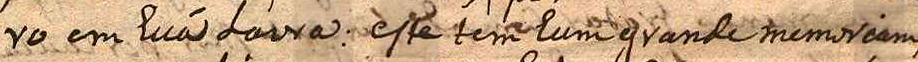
ro em huā Lavra: este tem hum grande memoriam,
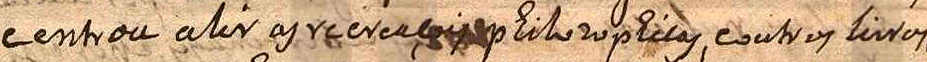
e entrou a lir as recreaçois philozophicas, e outros livros,
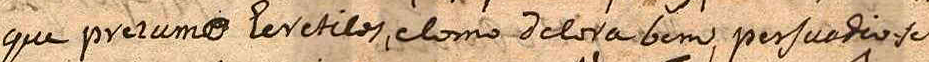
que prezumo hereticos, e como decora bem, persuadio-se
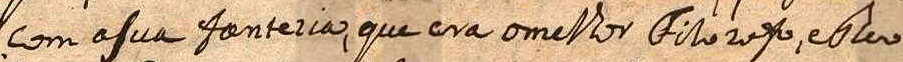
com a sua fantezia, que era o melhor Filozofo, e Theo
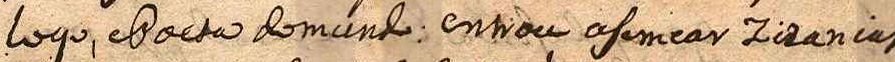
Logo, e Poeta do mundo: entrou a Semear Zizanias
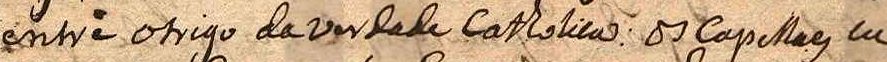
entre o trigo da verdade Catholica: os Capellaes cu
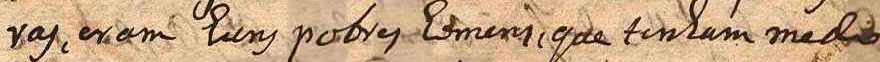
ras, eram huns pobres homens, que tinham medo
